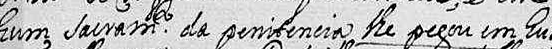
hum sacramto. da penitencia lhe pegou em hūa
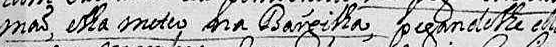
maõ, ella meteo na Bargilha, pegandolhe ella
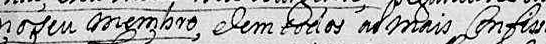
no seu membro, e em todas as mais Confisso
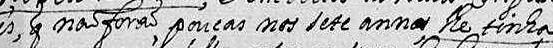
ẽs, q̄ naõ foraõ poucas nos sete annos, lhe tinha
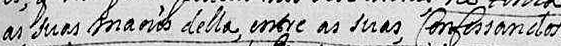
as suas manōs della, entre as suas, Confessandose
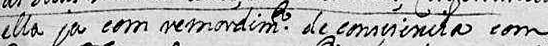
ella já com remordimto. de consciencia com
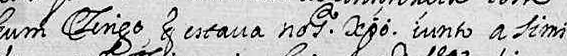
hum Clerigo, q̄ estaua no sto. xpō iunto a simi
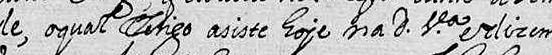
de, o qual Clerigo asiste hoje na d. V.a, e dizem
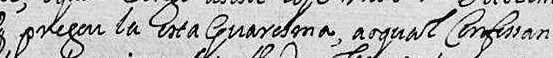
q̄ pregou la esta Quaresma, ao qual Confessan
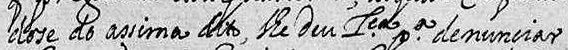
dose do assima dito, lhe deu L.ça p.a denunciar
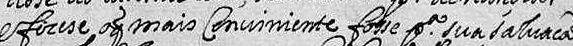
e fizese o q̄ mais Conuiniente fosse p.a sua saluaçaõ
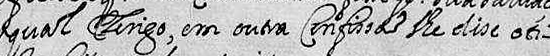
o qual Clerigo, em outra Confissaõ lhe dise o ti
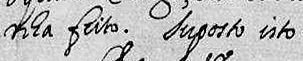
nha feito. Suposto isto
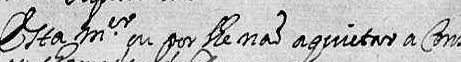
Esta m.er ou por lhe naõ aquietar a Cons
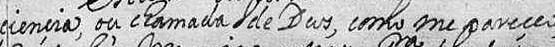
ciencia, ou chamada de Deos, como me pareceo,
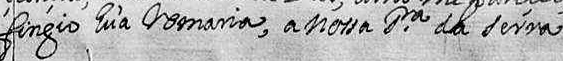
fingio hūa Romaria, a nossa s.ra da serra
